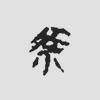𬒵
